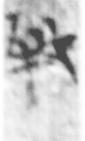牧
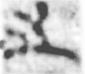之
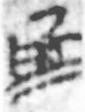爲
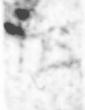○（左）
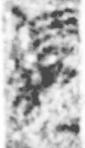驂
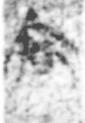高
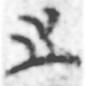之
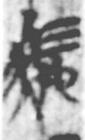駟
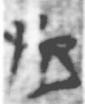○（左）
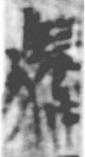○（服）
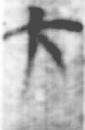大
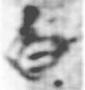首
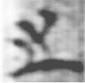之
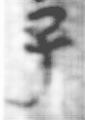子（牸）
